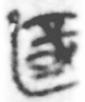國
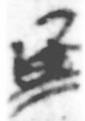爲
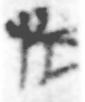○（左）
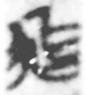飛（騑）
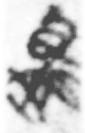嬛
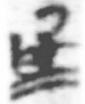爲
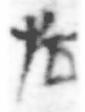○（左）
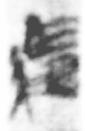驂
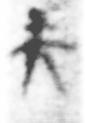夫
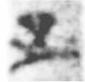之
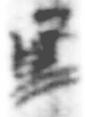爲
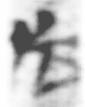○（左）
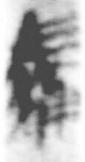○（服）
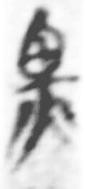黑
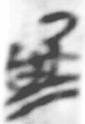爲
